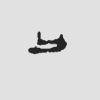是
